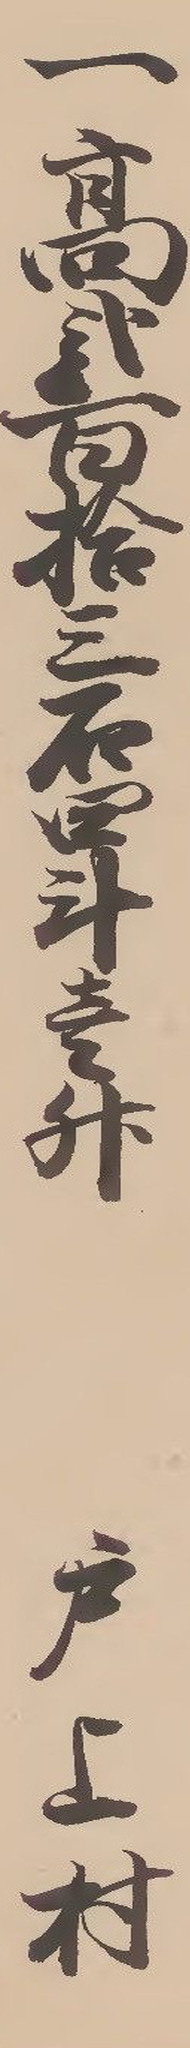一高弐百拾三石四斗壱升戸上村
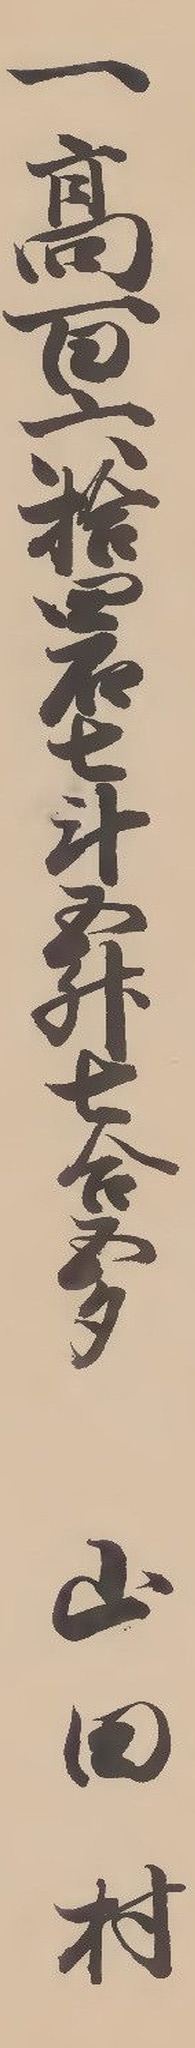一高百六拾四石七斗五升七合五勺山田村
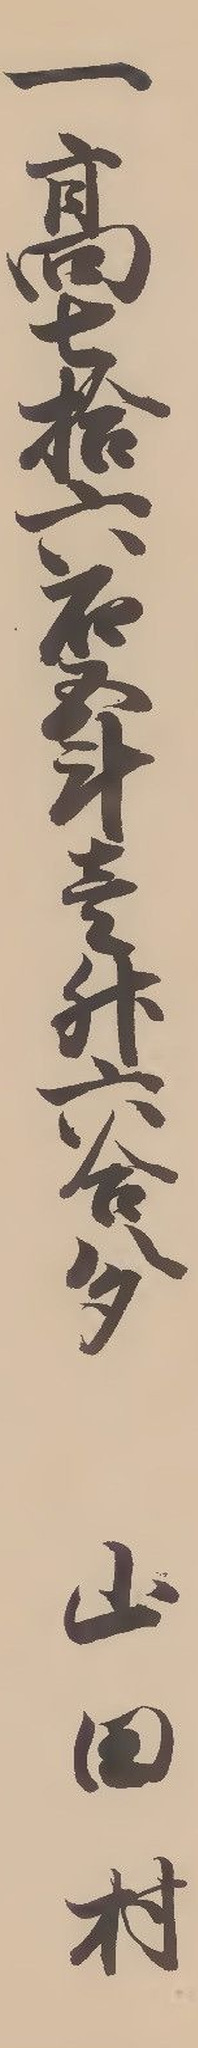一高七拾六石五斗壱升六合八勺山田村
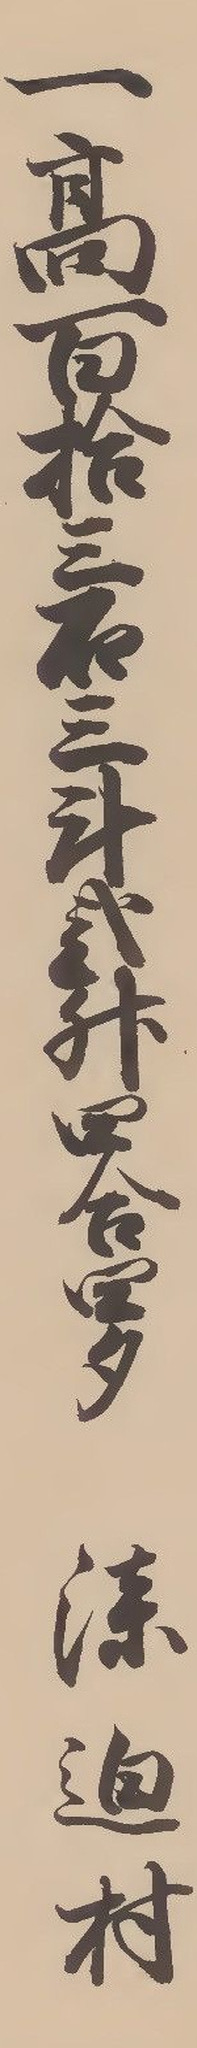一高百拾三石三斗弐升四合四勺漆迫村
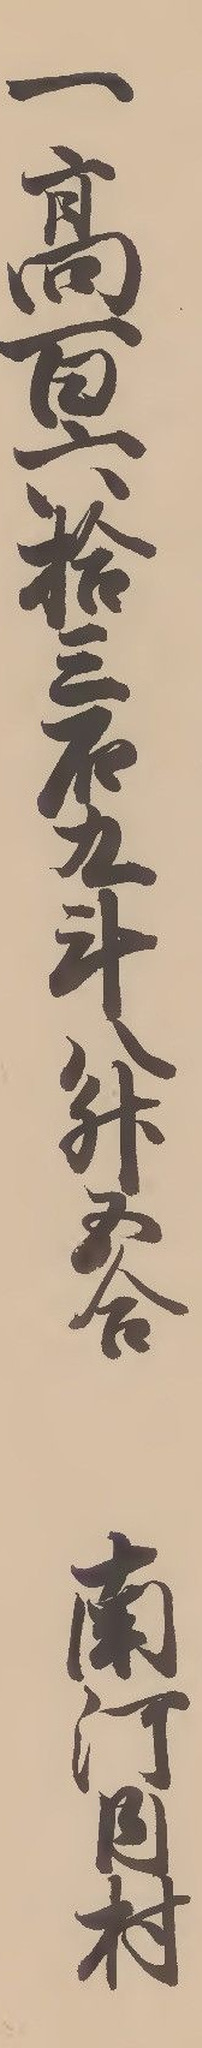一高百六拾三石九斗八升五合南河内村

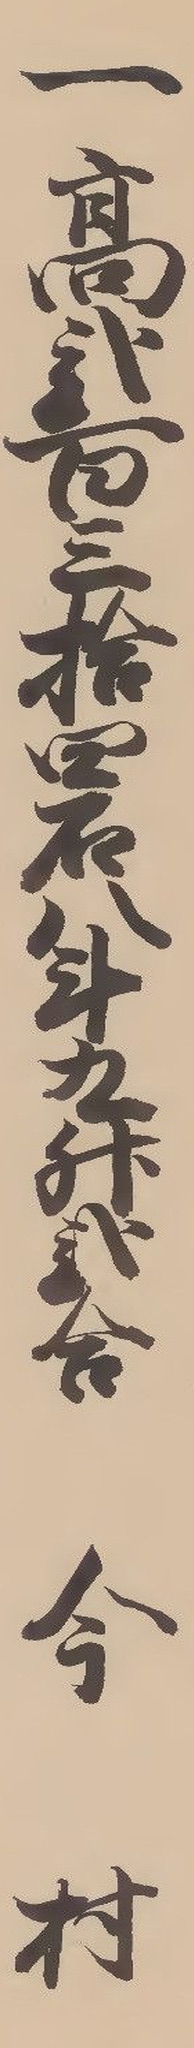一高弐百三拾四石八斗九升弐合今村
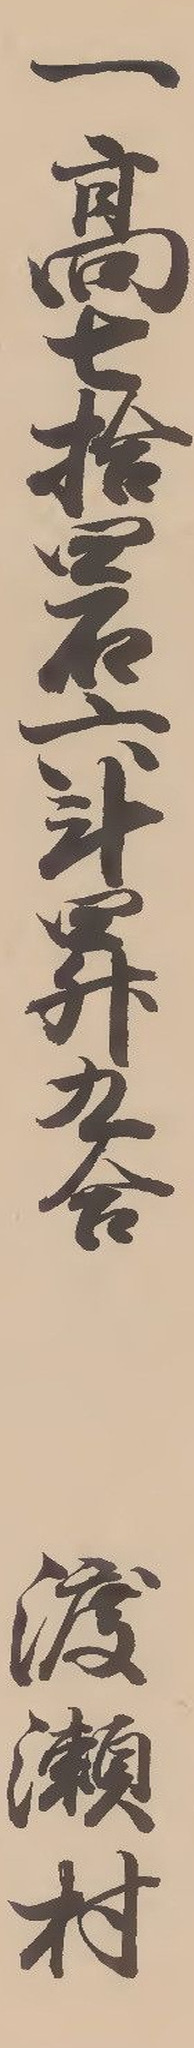一高七拾四石六斗四升九合渡瀬村
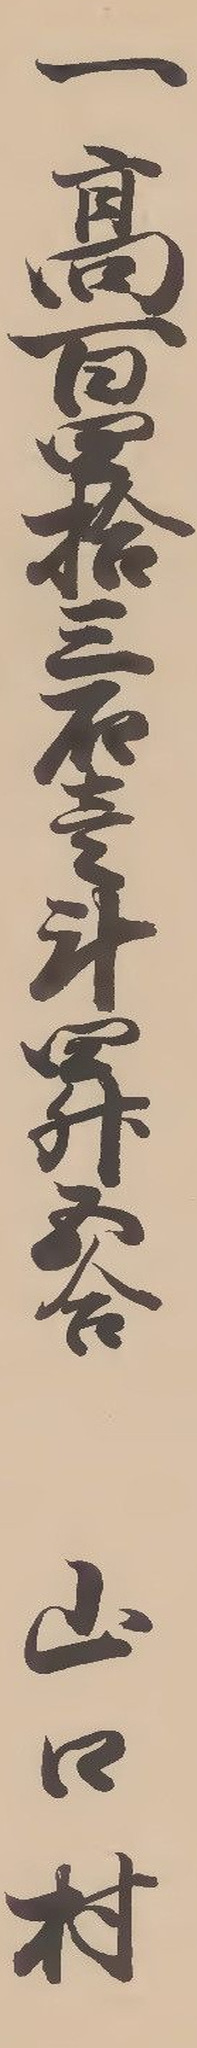一高百四拾三石壱斗四升五合山口村
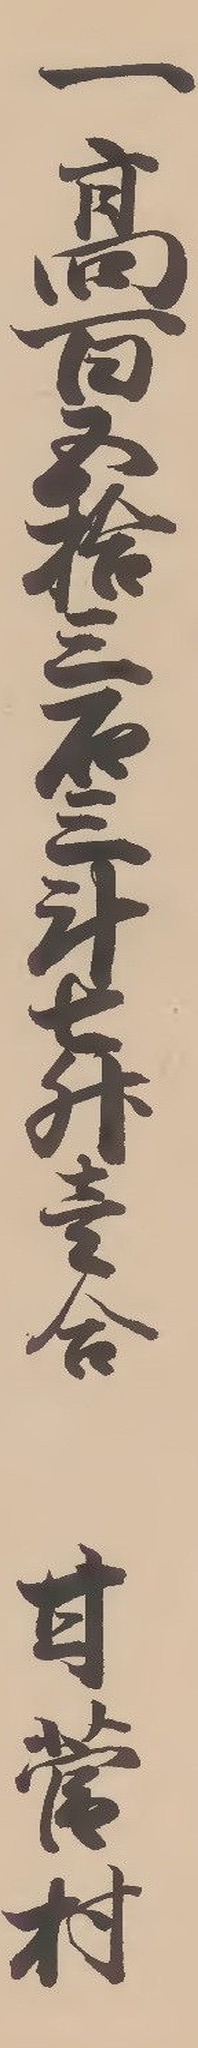一高百五拾三石三斗七升壱合甘菅村
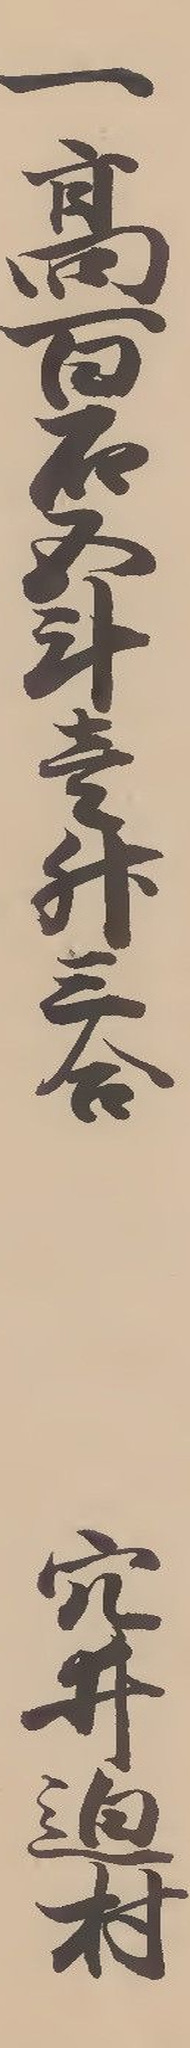一高百石五斗壱升三合穴井迫村
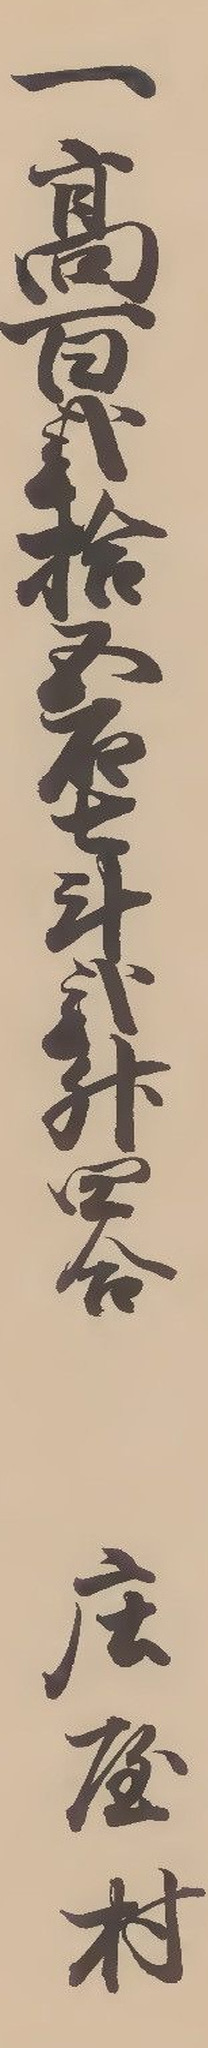一高百弐拾五石七斗弐升四合庄屋村
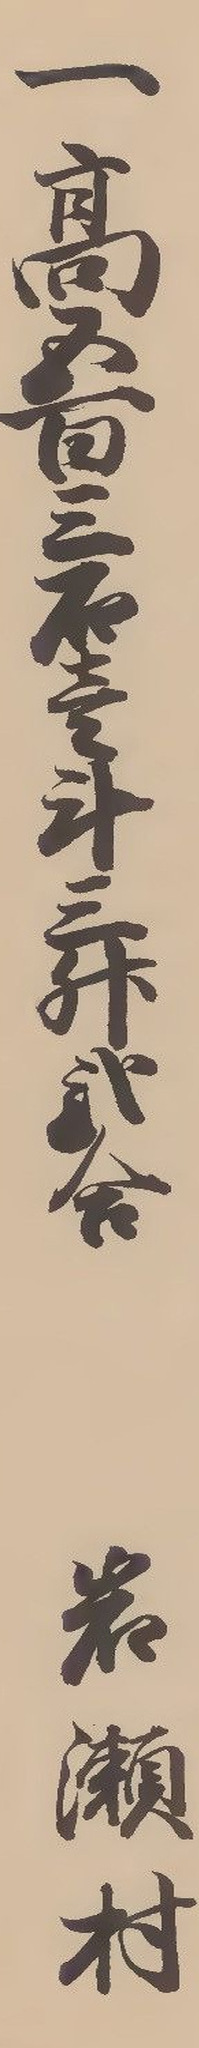一高五百三石壱斗三升弐合岩瀬村

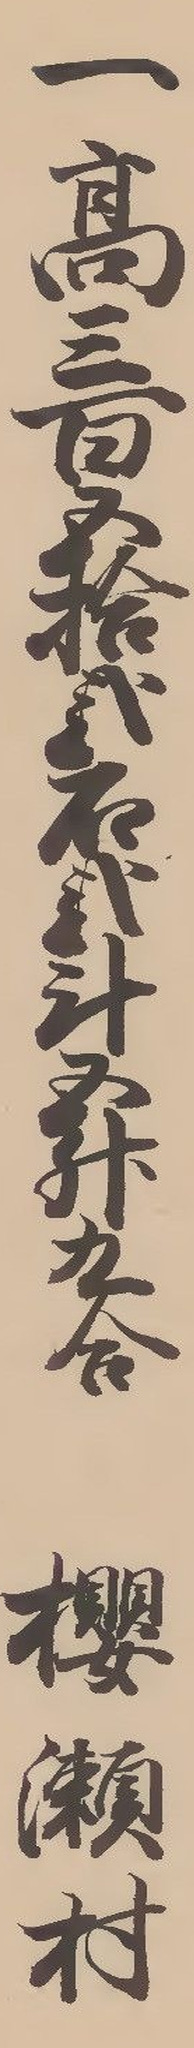一高三百五拾弐石弐斗五升九合桜瀬村
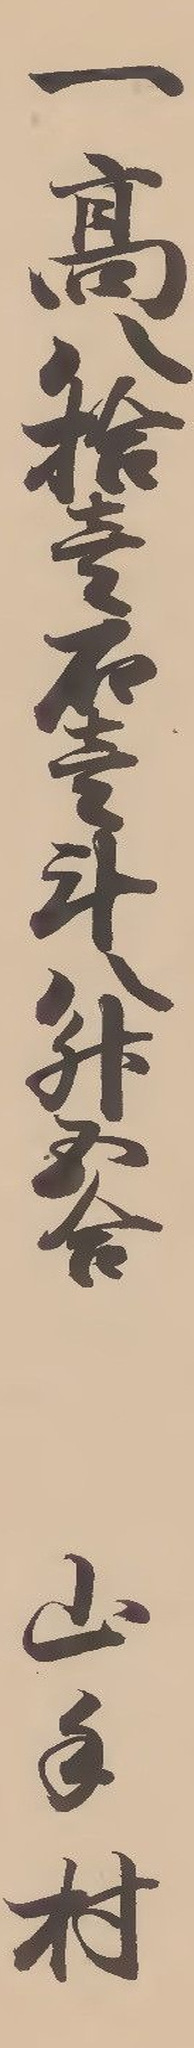一高八拾壱石壱斗八升五合山手村
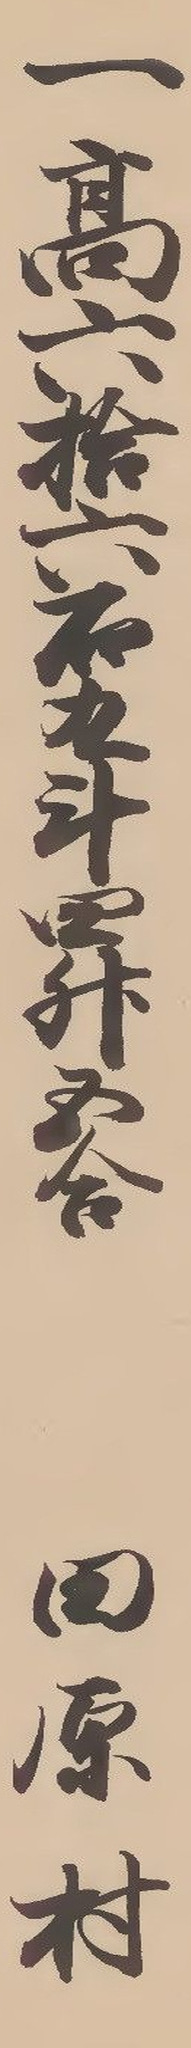一高六拾六石九斗四升五合田原村
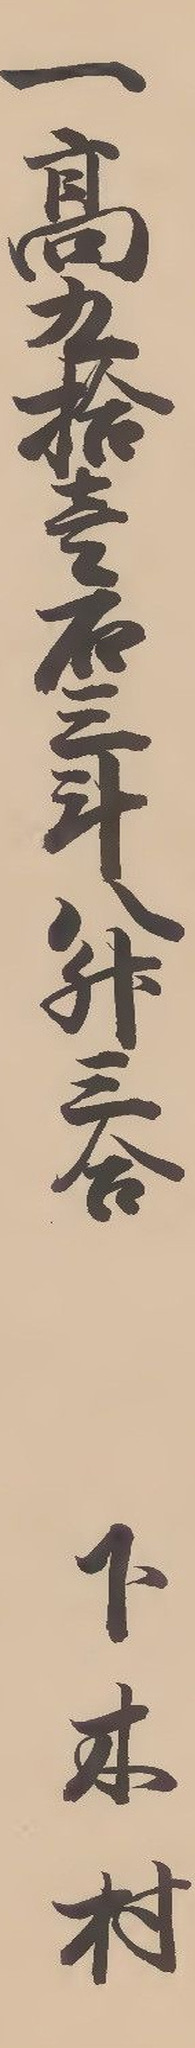一高九拾壱石三斗八升三合下木村
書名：豊後国郷帳
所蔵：国立公文書館 National Archives of Japan
